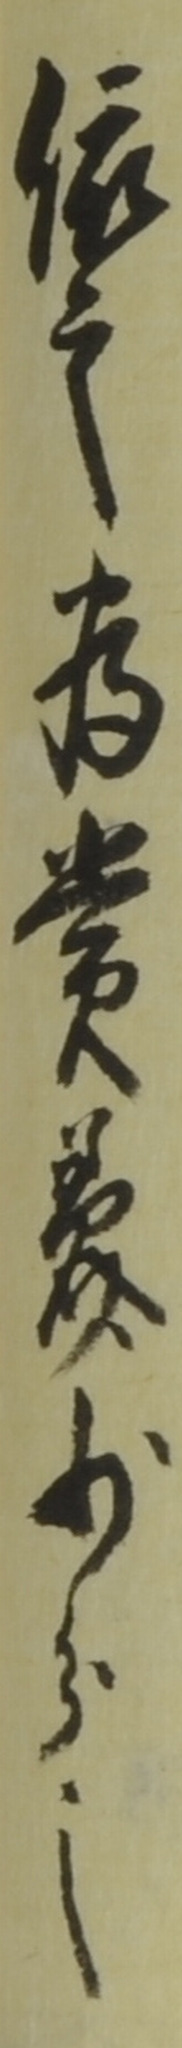依之為賞美少分之
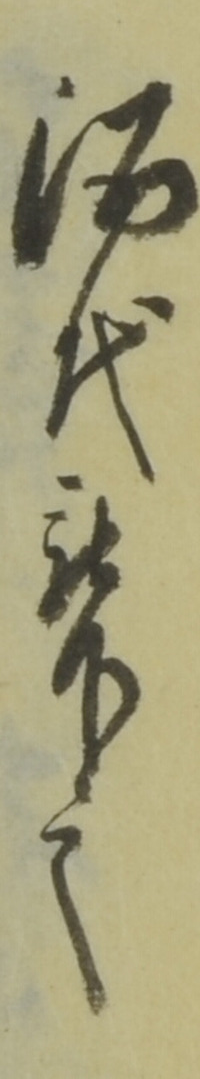酒代被下之
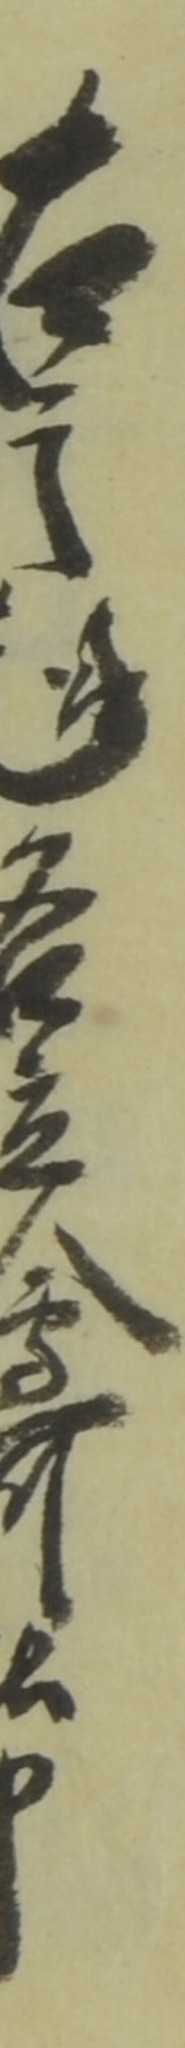右之趣名立会可被申

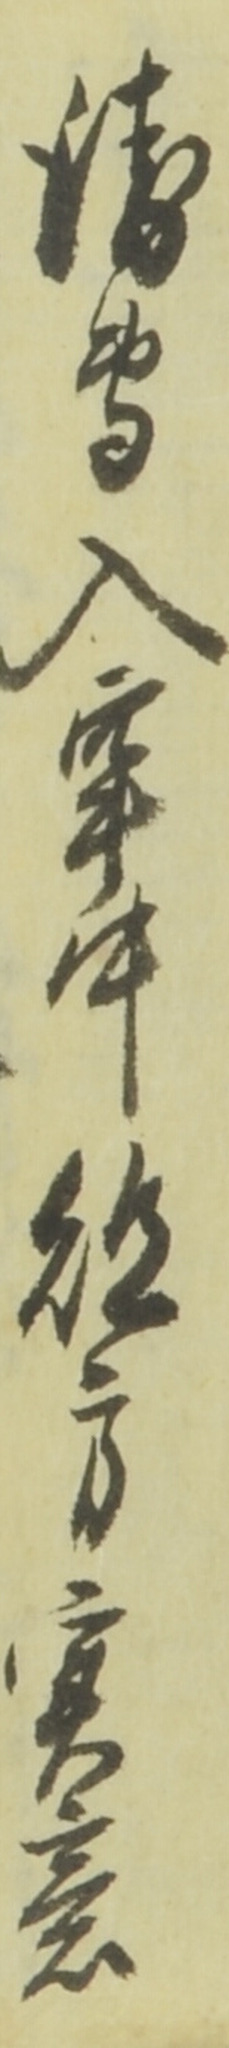勝専入窂中賄方実意
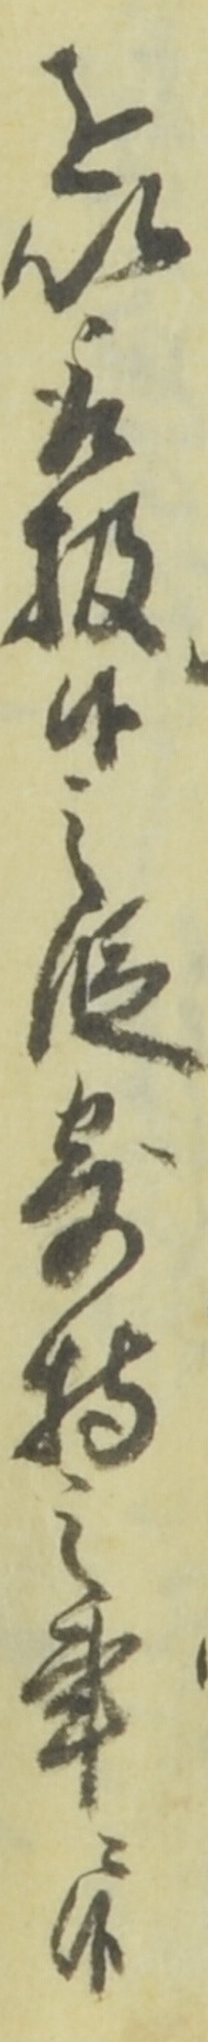を以取扱候之段奇特之事ニ候
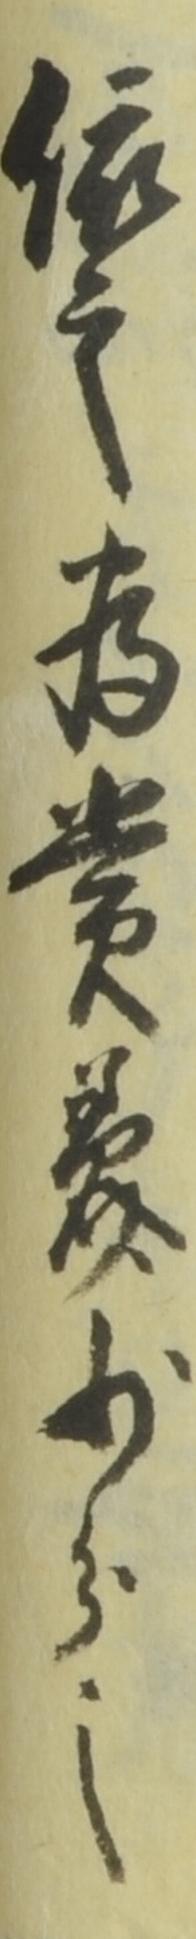依之為賞美少分之
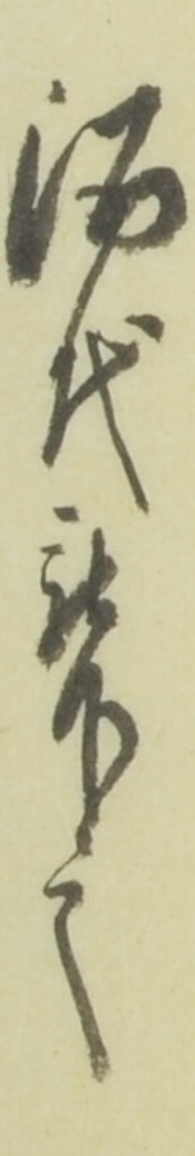酒代被下之
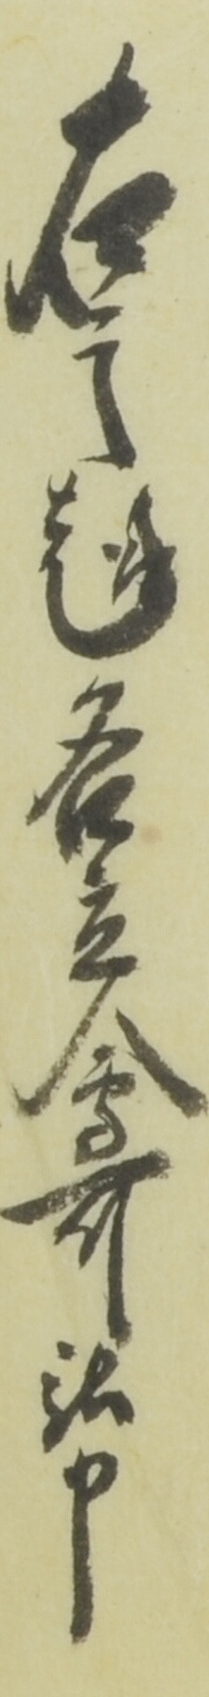右之趣各立会可被申
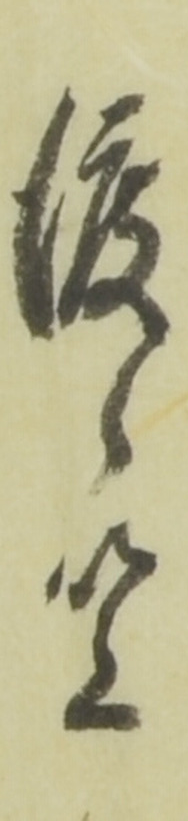渡候以上
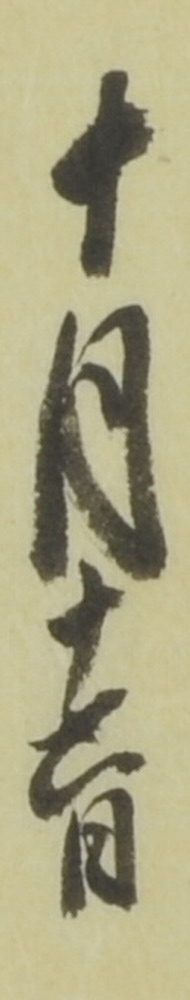十月十六日
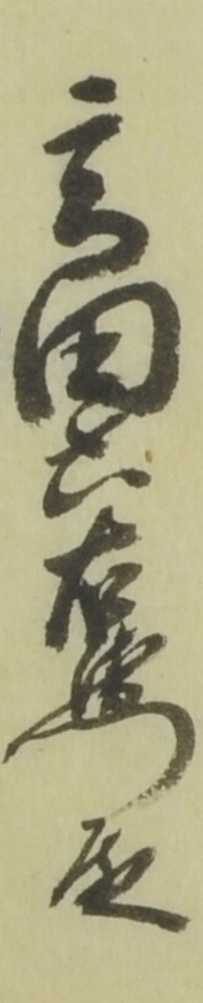高田六右衛門殿
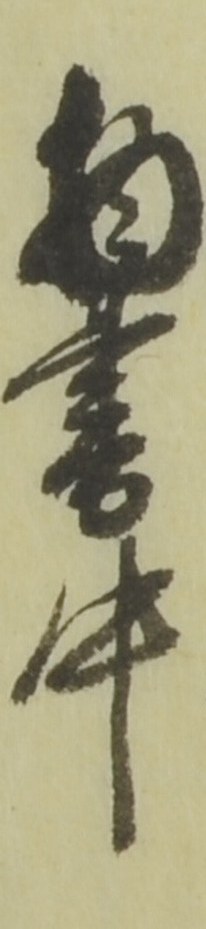物書中
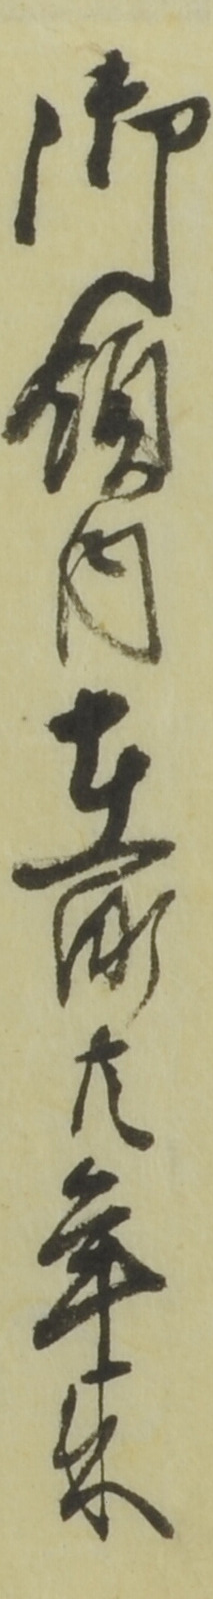御領内在町共年来
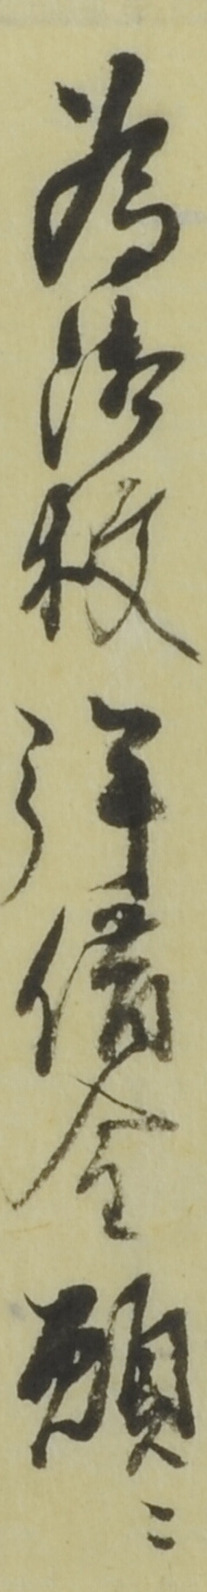為御救拝借金願ニ
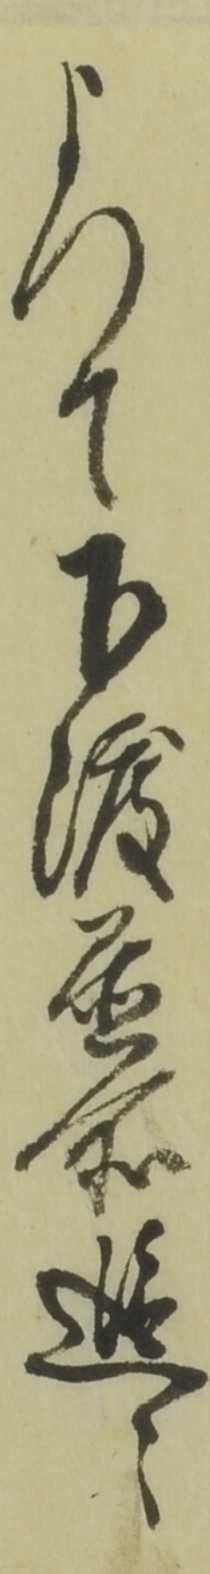よつて下渡置所追々
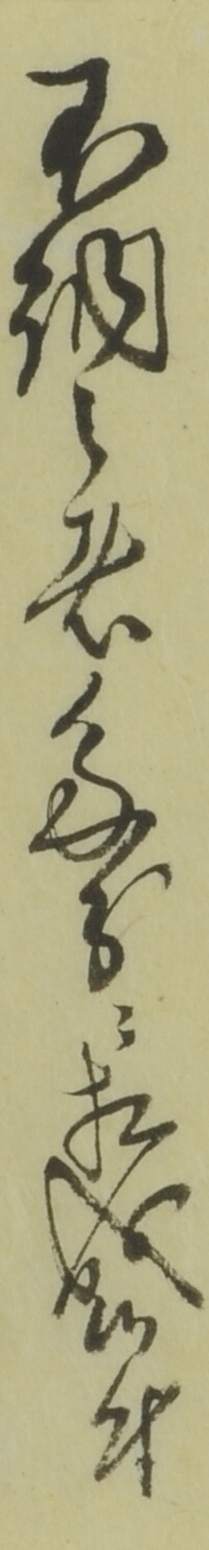不納候者多分ニ相成候付
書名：御触書御書附控
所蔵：伊那市立高遠町図書館・合同会社AMANE
